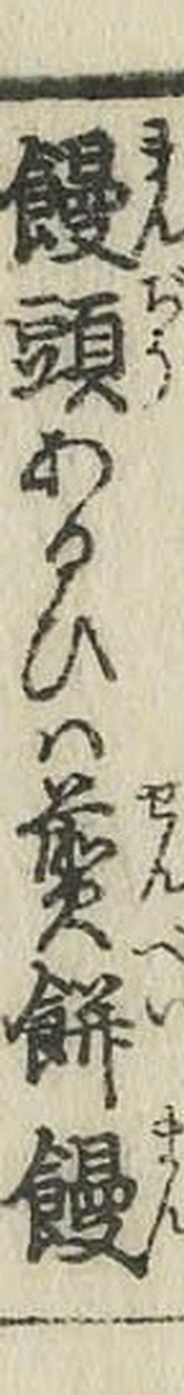饅頭あるひは煎餅饅
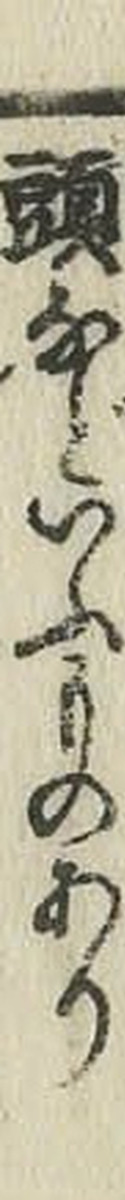頭などいふものあり
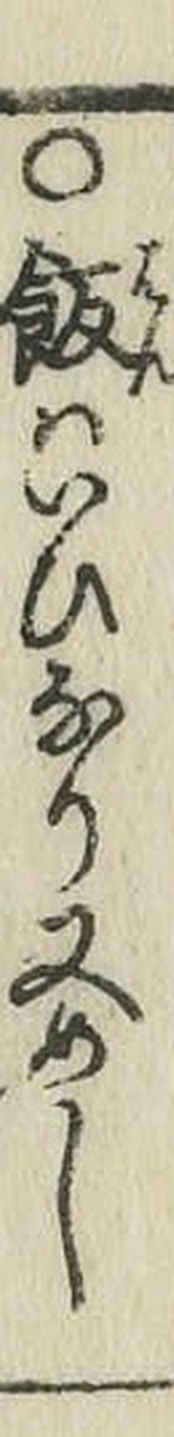○飯はいひなり又めし
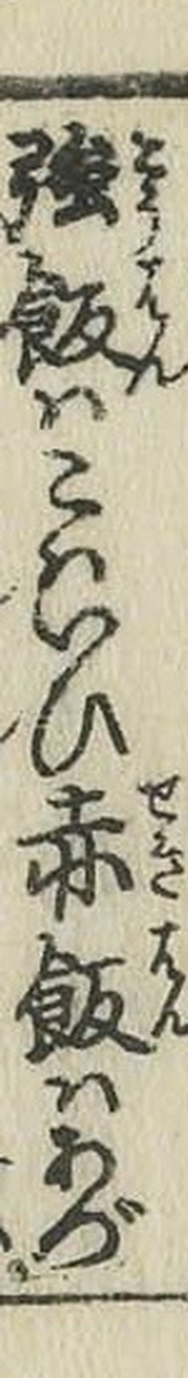強飯はこはいひ赤飯はあづ
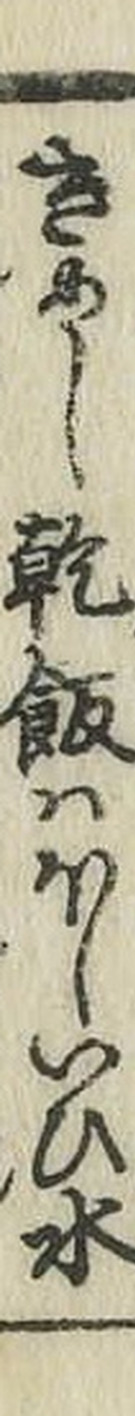きめし乾飯はほしいひ水
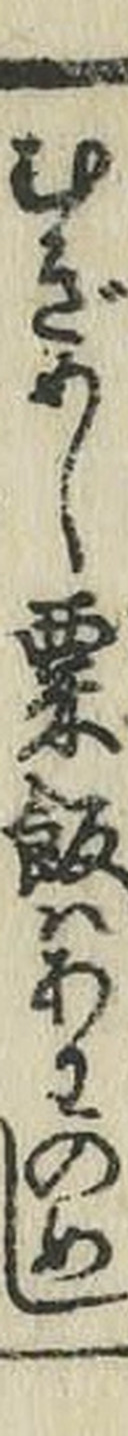むぎめし粟飯はあわのめし

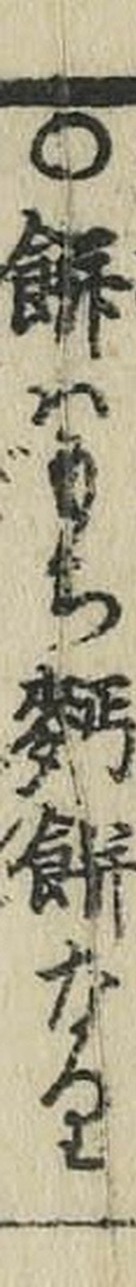○餅はもち麺餅なり
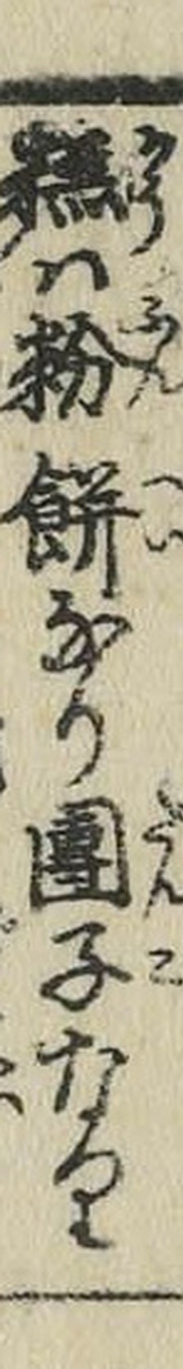糕は粉餅なり団子なり
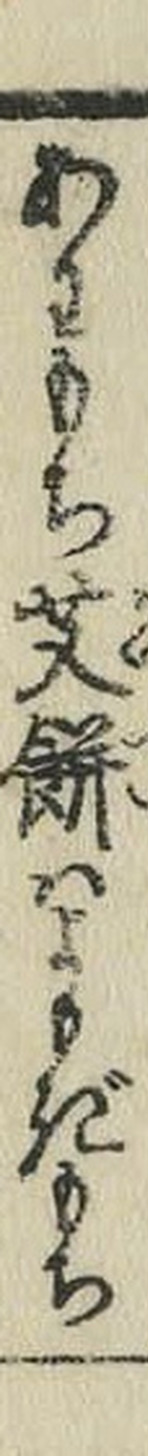あわもち艾餅はよもぎもち
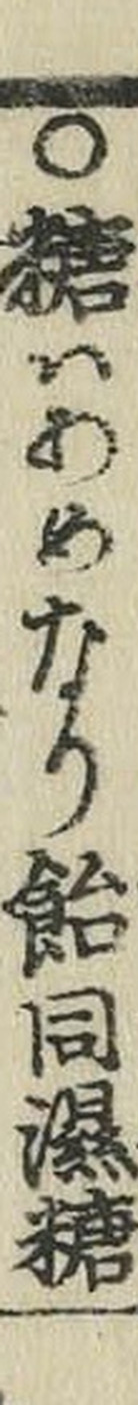○糖はあめなり飴同湿糖
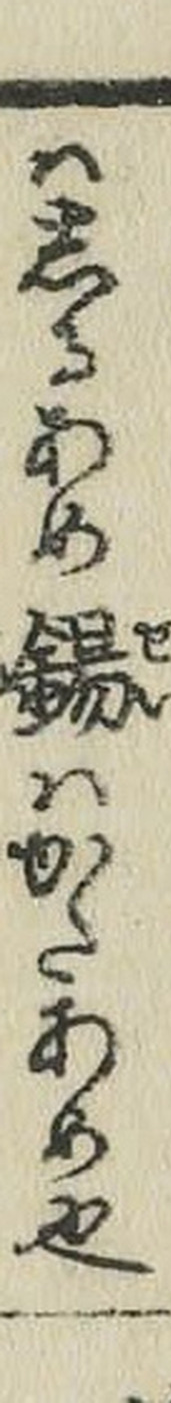はしるあめ𩛿はかたあめ也
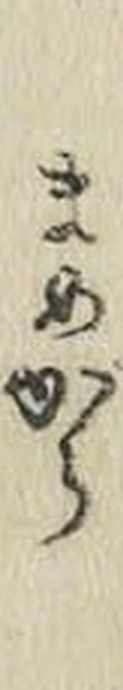まめがら
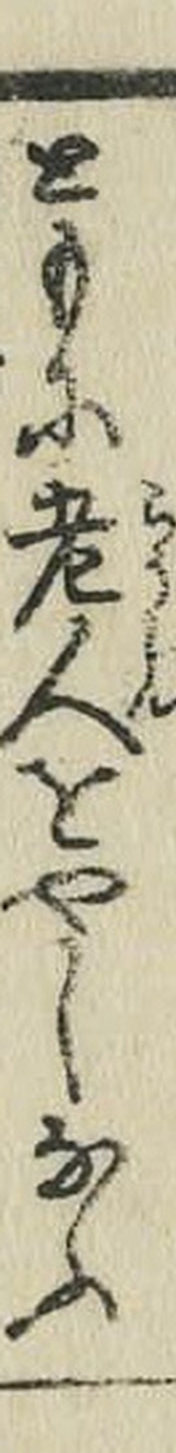ともに老人をやしなふ
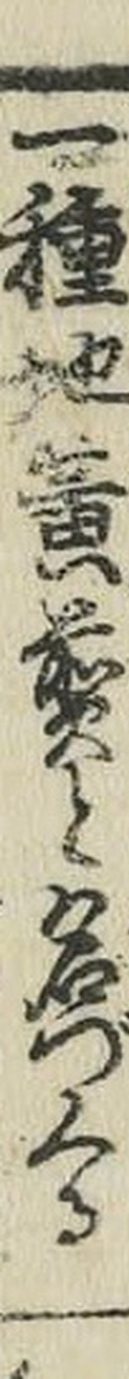一種地黄煎と名づくる
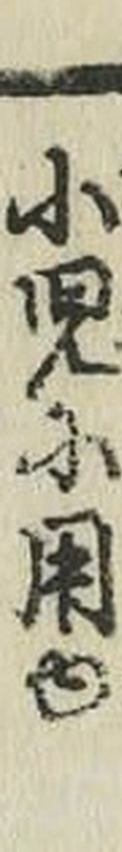小児に用ゆ
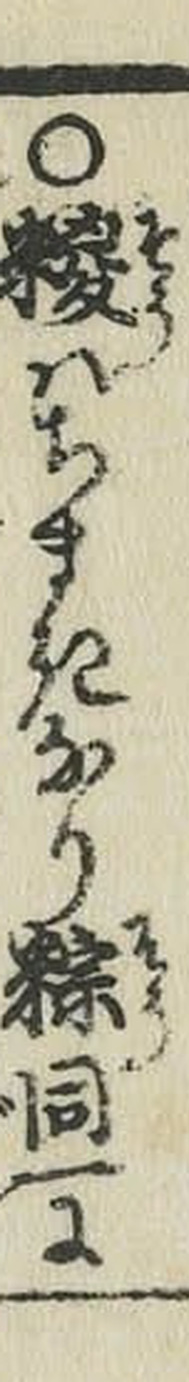○糉はちまきなり粽同一に
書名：増補頭書訓蒙図彙大成 10巻 7:巻之14-16
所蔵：東京学芸大学教育コンテンツアーカイブ
